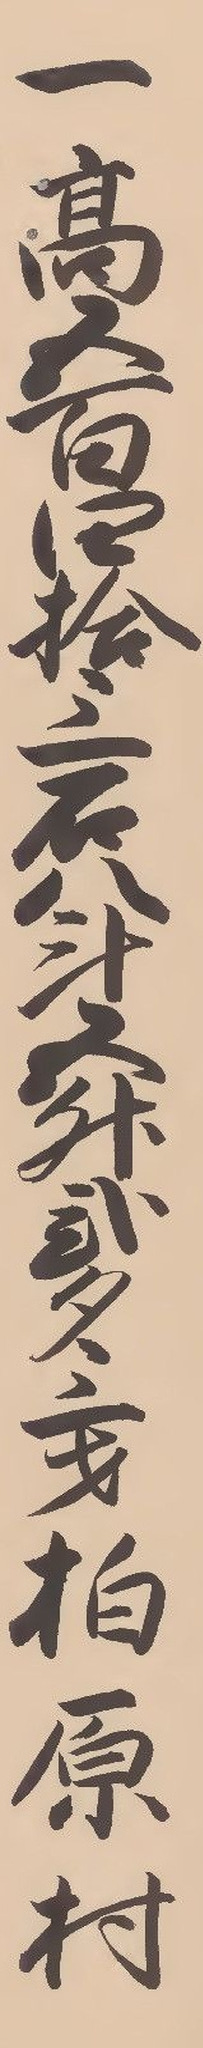一高五百四拾三石八斗五升弐勺三才柏原村
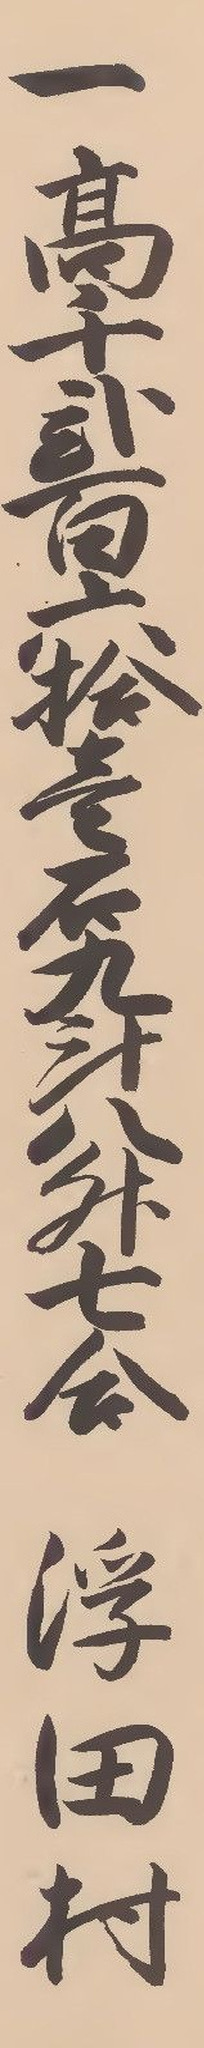一高千弐百六拾壱石九斗八升七合浮田村
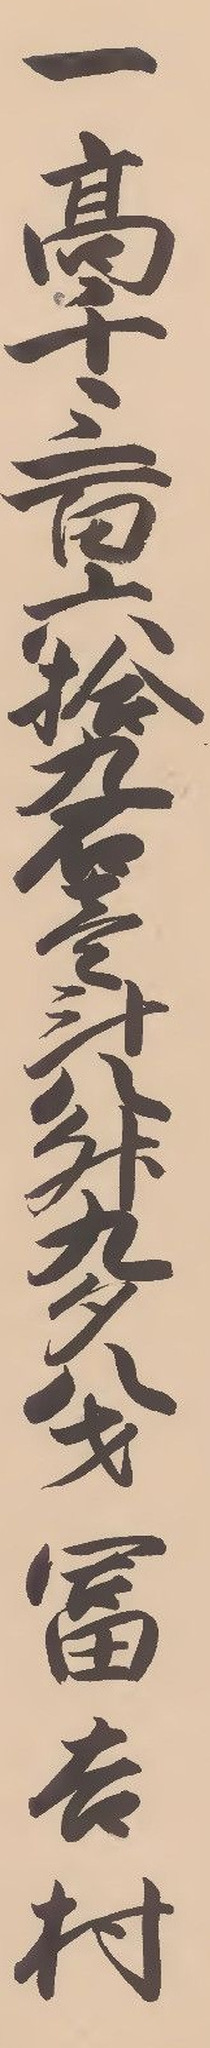一高千三百六拾九石壱斗八升九勺八才富吉村
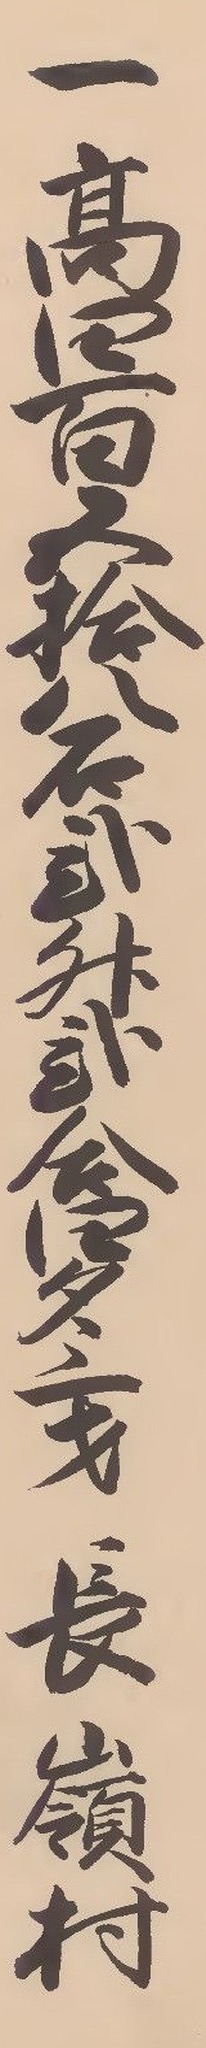一高四百五拾八石弐升弐合四勺三才長嶺村

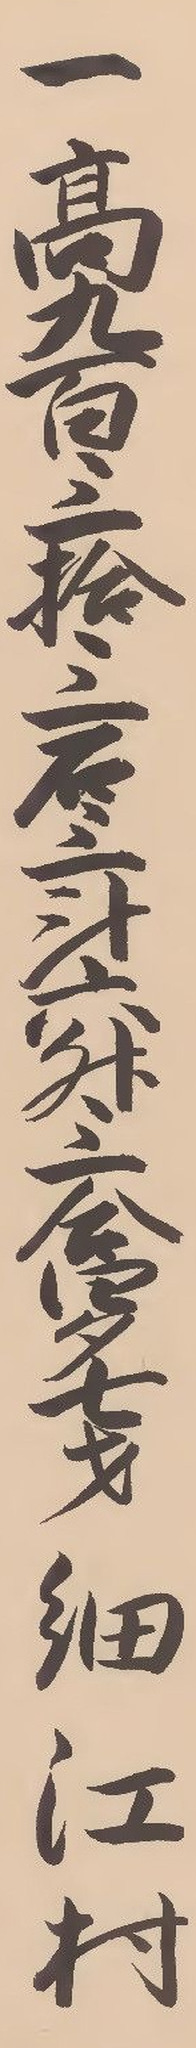一高九百三拾三石三斗六升三合四勺七才細江村
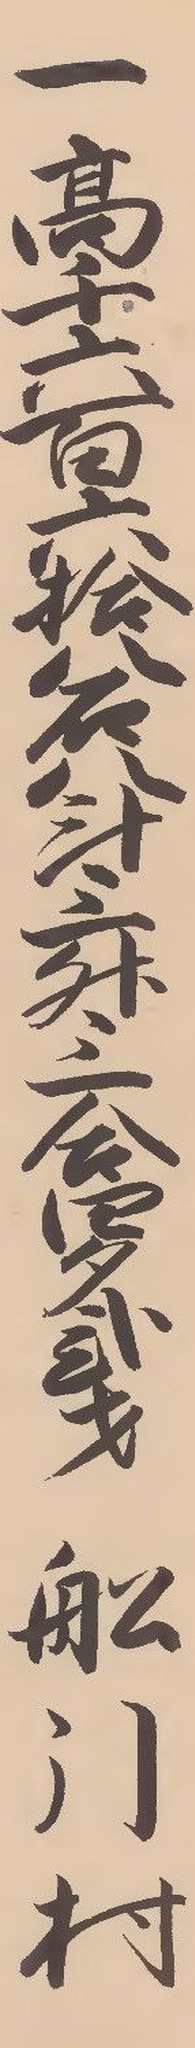一高千六百六拾八石八斗三升三合四勺弐才船引村
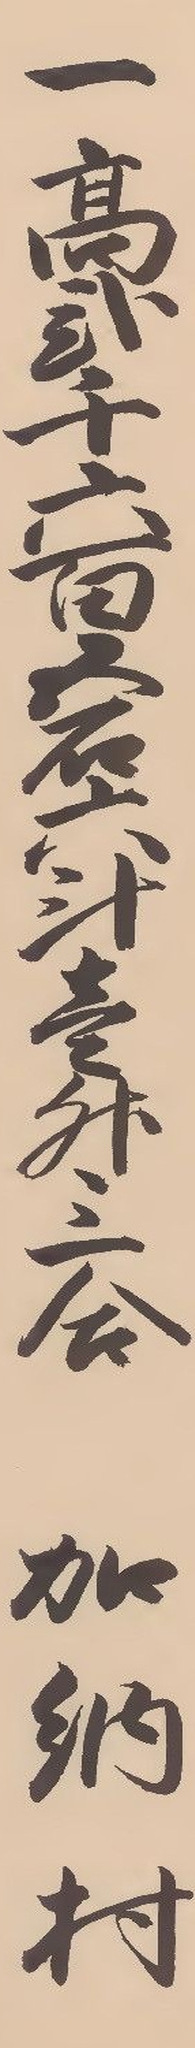一高弐千六百五石六斗壱升三合加納村
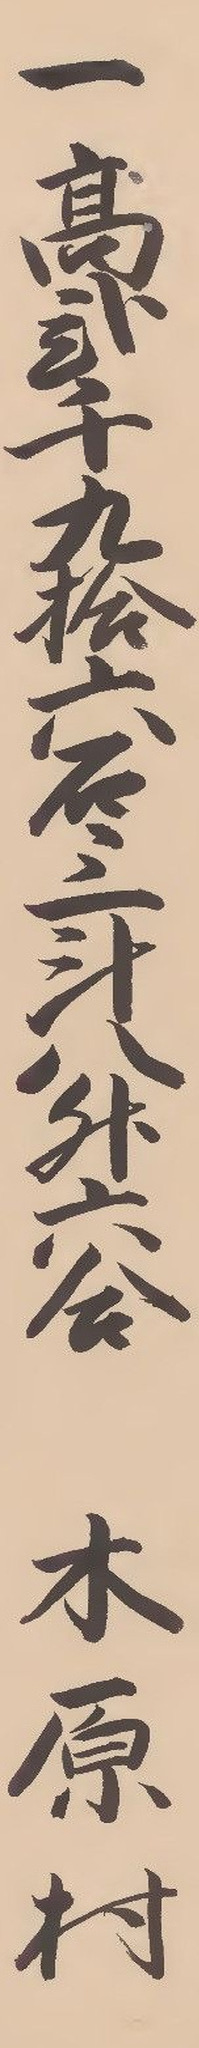一高弐千九拾六石三斗八升六合木原村
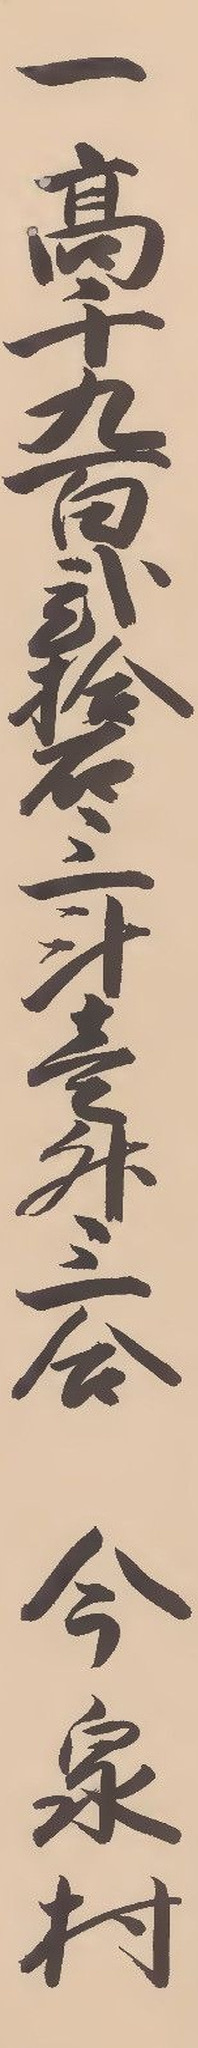一高千九百弐拾石三斗壱升三合今泉村
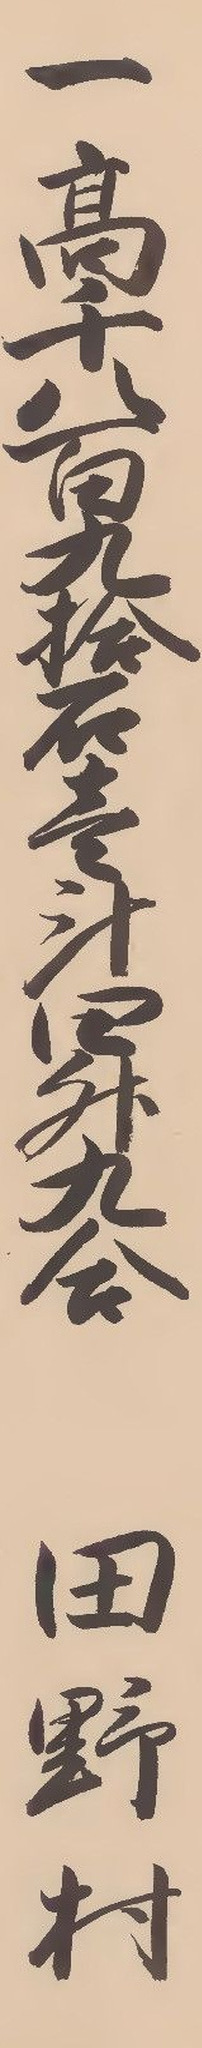一高千八百九拾石壱斗四升九合田野村
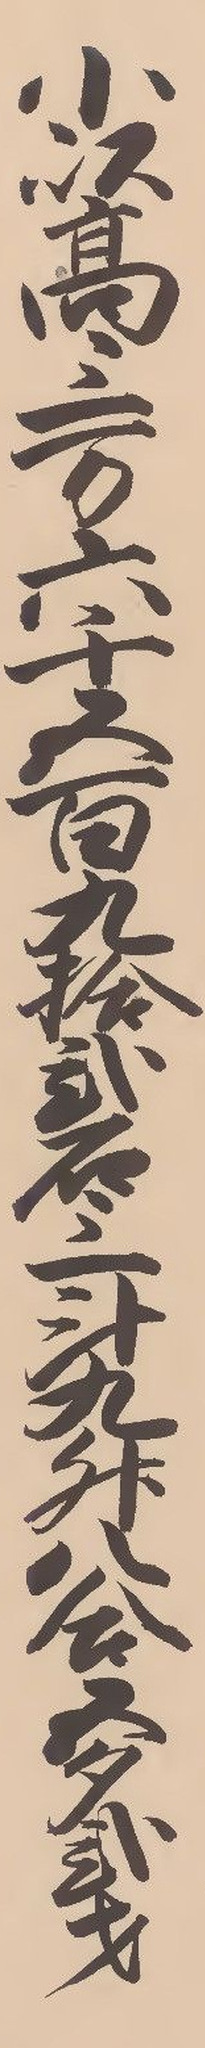小以高三万六千五百九拾弐石三斗九升八合五勺弐才

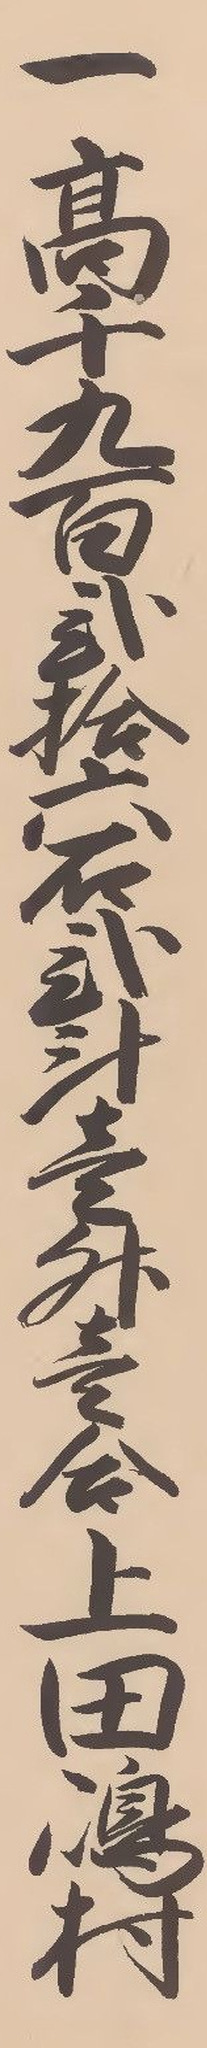一高千九百弐拾六石弐斗壱升壱合上田島村
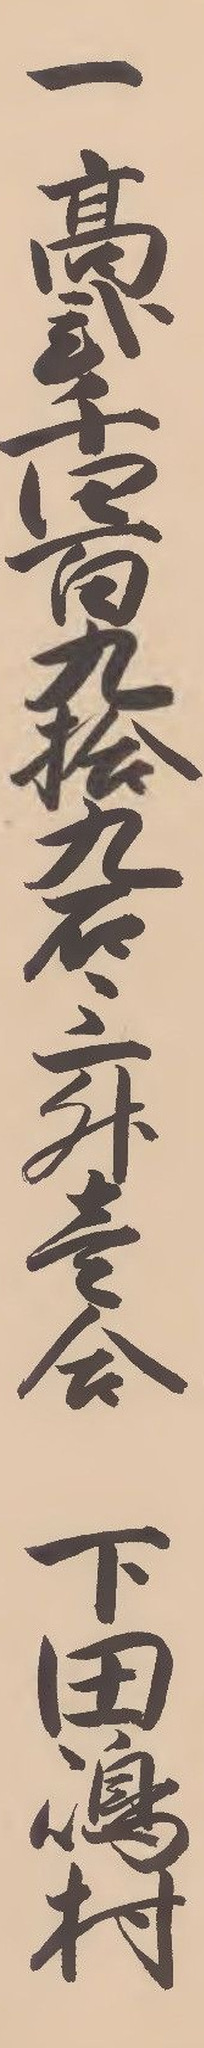一高弐千四百九拾九石三升壱合下田島村
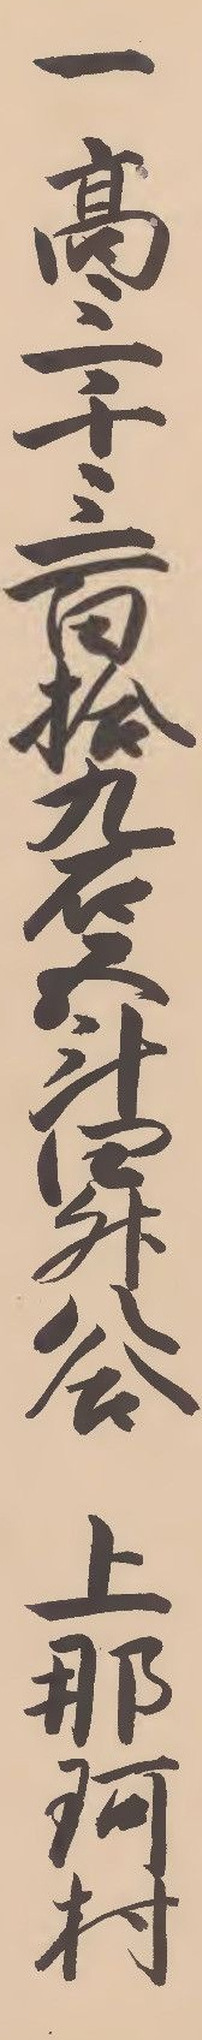一高三千三百拾九石五斗四升八合上那珂村
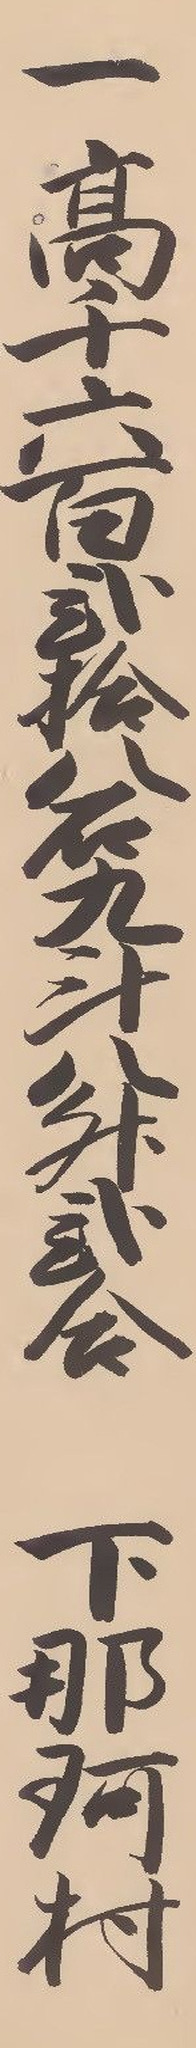一高千六百弐拾八石九斗八升弐合下那珂村
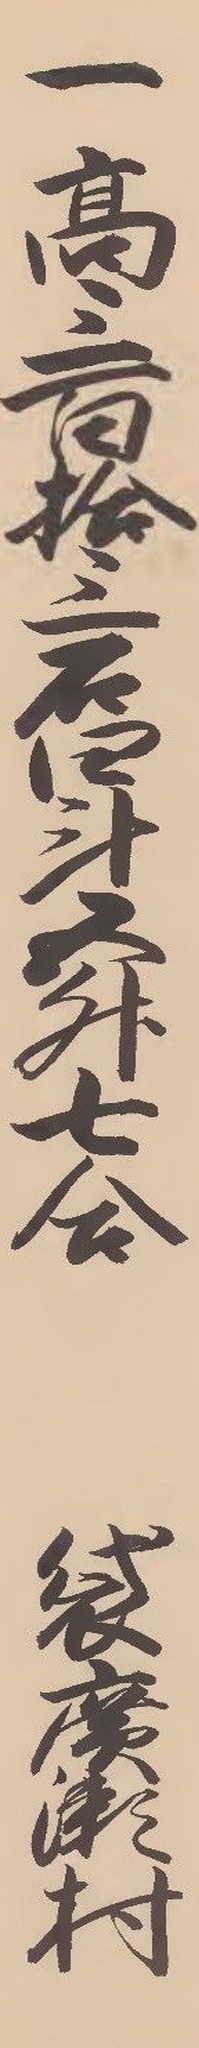一高三百拾三石四斗五升七合袋広瀬村
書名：日向国郷帳
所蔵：国立公文書館 National Archives of Japan
